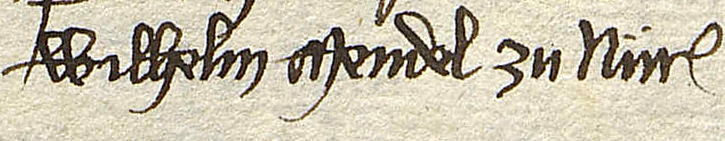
wilhelm Mendel ʒu Nür*
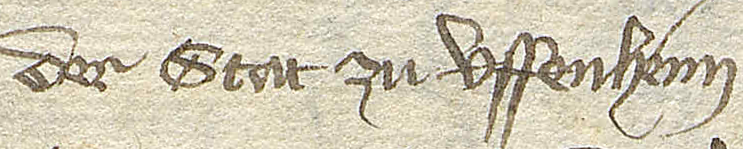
Der Stat ʒu Vffenheim
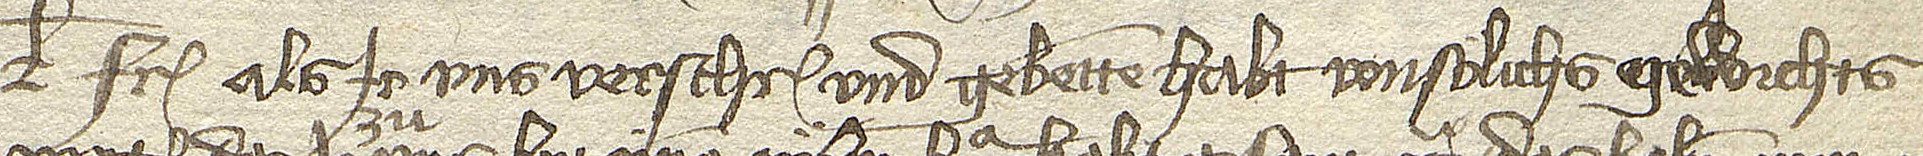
L* fr* als Ir vns verſchr* vnd gebette* habt von ſölichs gewichts
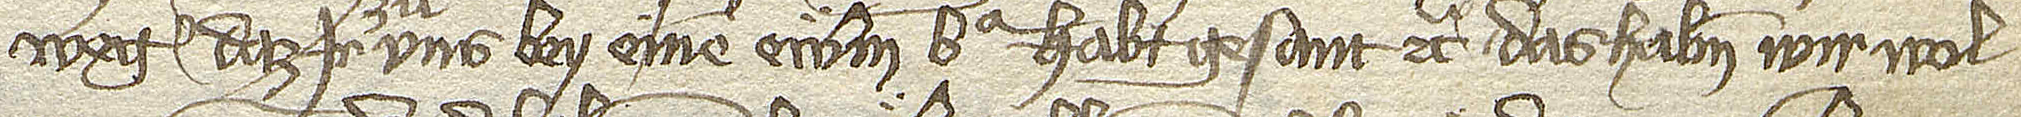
weg* daʒ Ir vns bey eine* ew*m b* habt geſant ec* / das habn* wir wol
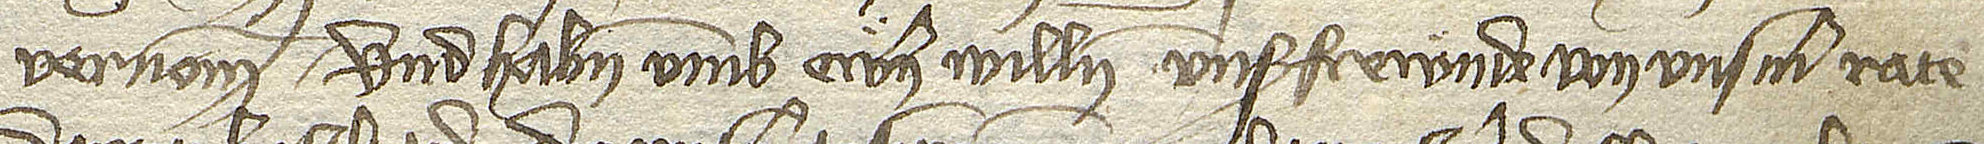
vernom* / Vnd habn* vmb ew*n willn* vnſ* frewnde von vnſm* rate
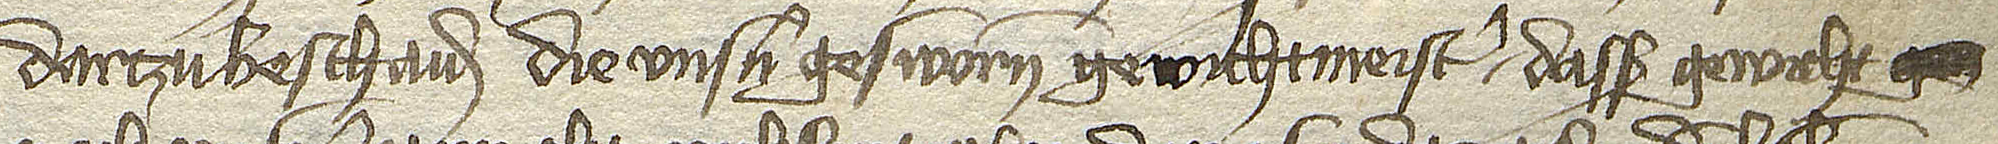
Darcʒu beſchaid* die vnſn* geſworn* gewichtmeiſt* / daſſ* gewicht g%%
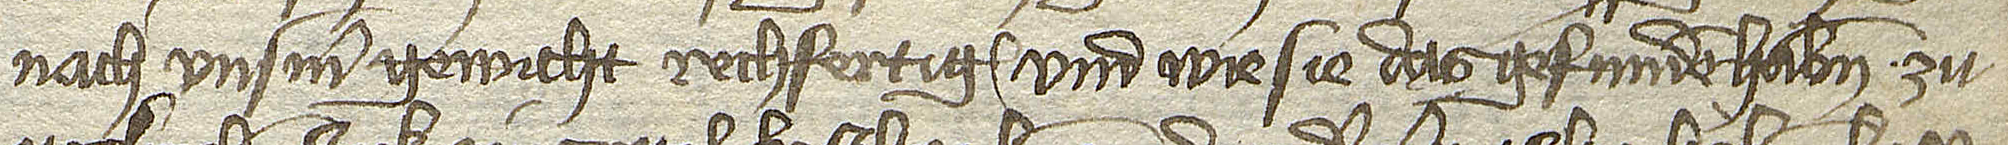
nach vnſm* gewicht rechfertig* vnd wie ſie das gefunde* habn* . ʒu
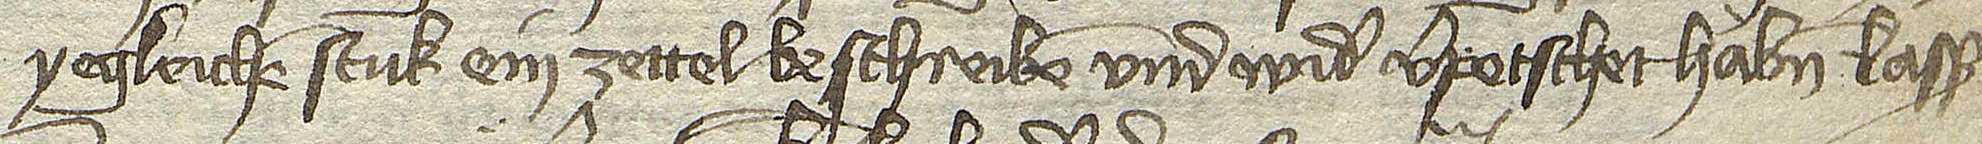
yegleiche* ſtuk ein ʒettel beſchreibe* vnd wid* v*petſchet habn* laſſ*
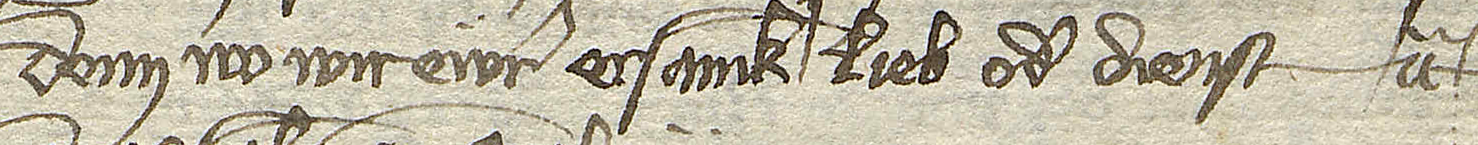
Denn wo wir ewr* erſamk* lieb od* dienſt ec*
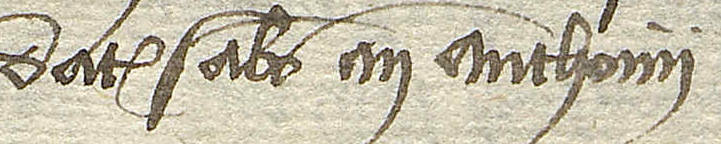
Dat* ſabo* an* Anthonii
